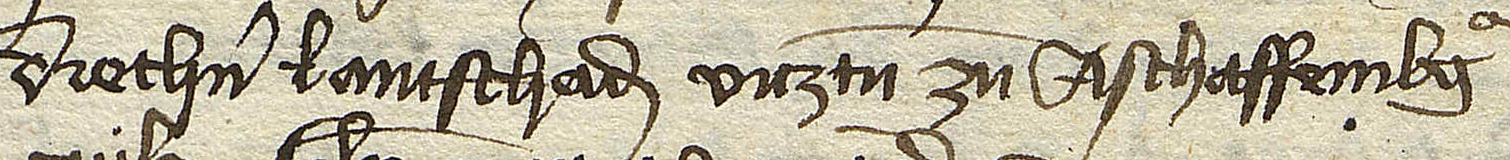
Diethn* lantſchad* vicʒtu* ʒu Aſchaffemb*g
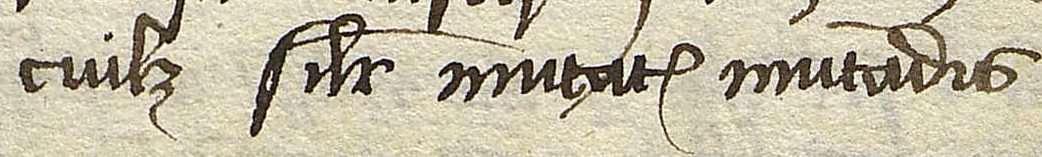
cuil* ſilr* mutat* muta*dis
